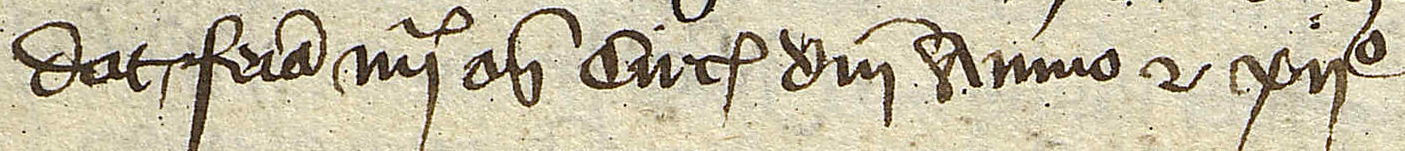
dat* / feia* iiii* an* Cric* dni* Anno @ xii*
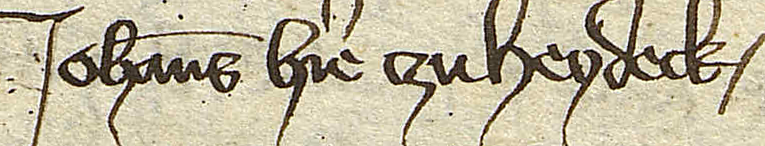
Iohans* h*re cʒu heydeck /
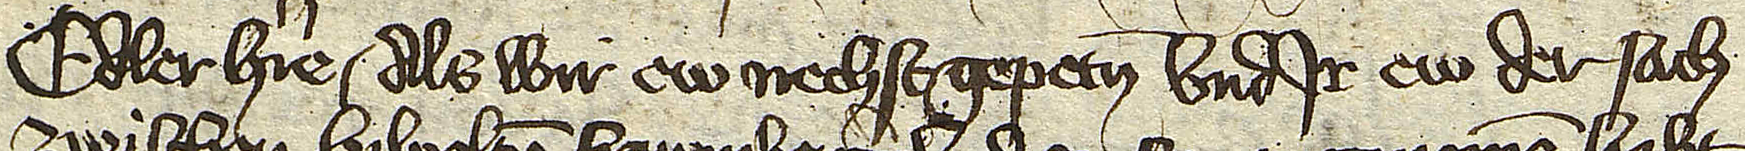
Edler h*re / Als wir ew nechſt gepetn* vnd Ir ew der ſach
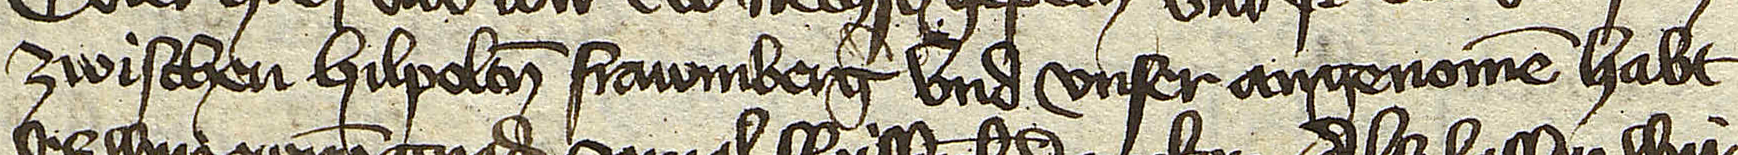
cʒwiſchen hilpoltn* frawmberg* vnd vnſer angenome* habt
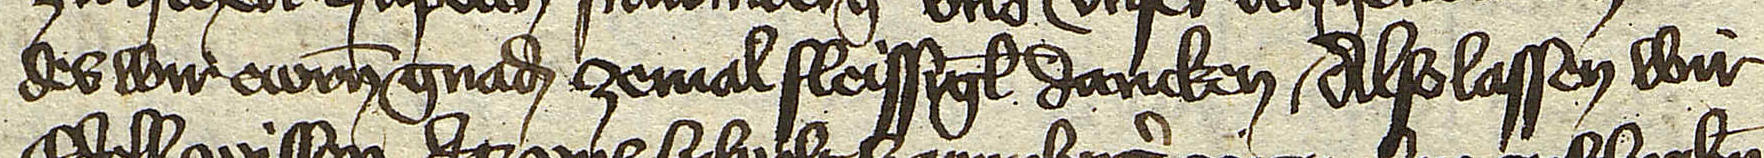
des wir ewrn* gnad* cʒemal fleiſſigl* dancken / Alſo laſſen wir
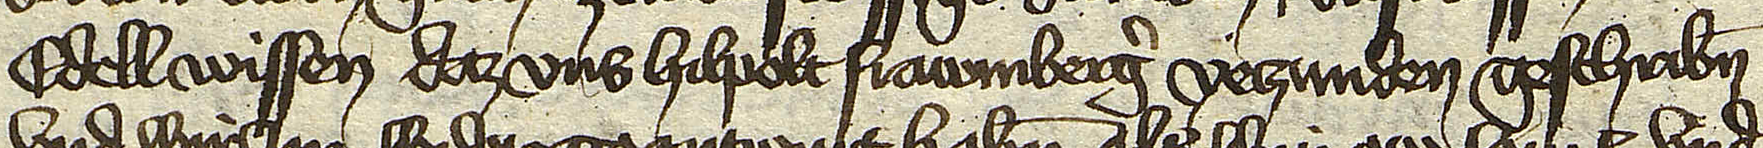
Edell wiſſen daʒ vns hilpolt frawmberg* yecʒunden geſchribn*
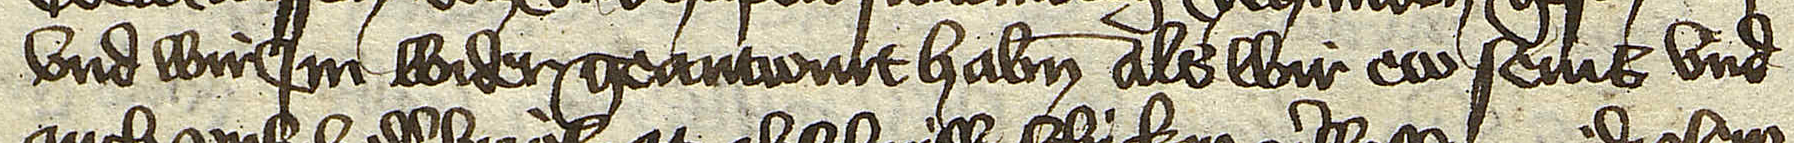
vnd wir Im wider geantwurt habn* als wir ew ſeins vnd
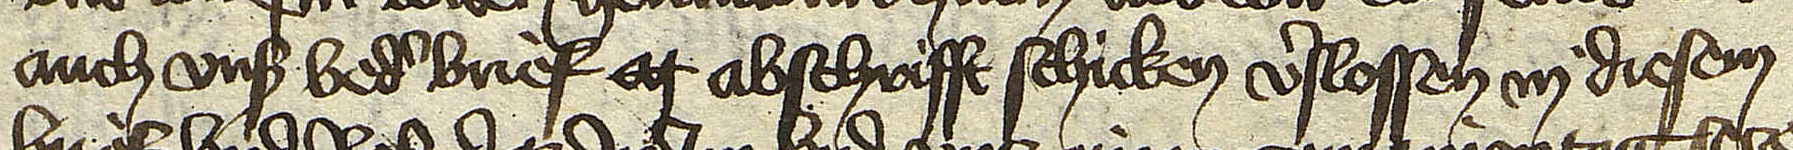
auch vnſ* bed* brief aſ abſchrifft ſchicken v*ſloſſen in dieſem
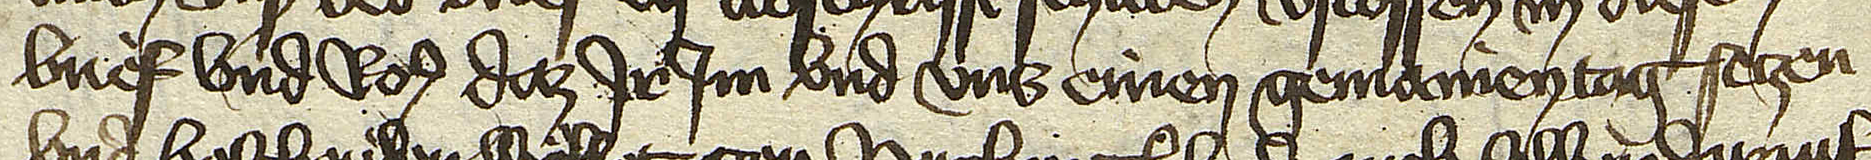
brief vnd Ro* daʒ Ir Im vnd vns einen gemeinen tag ſecʒen
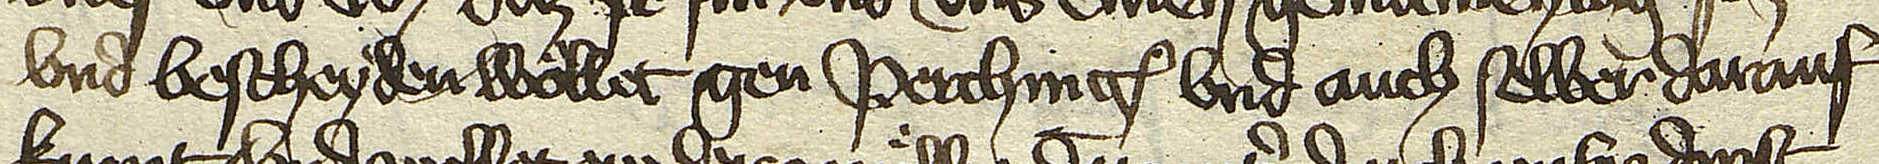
vnd beſcheyden wöllet gen Perching* vnd auch ſelber darauf
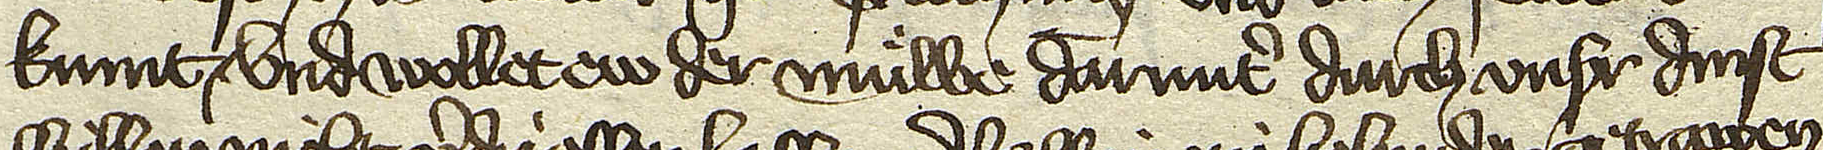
kumt / vnd wollet ew der müwe darunt* durch vnſ*r dinſt
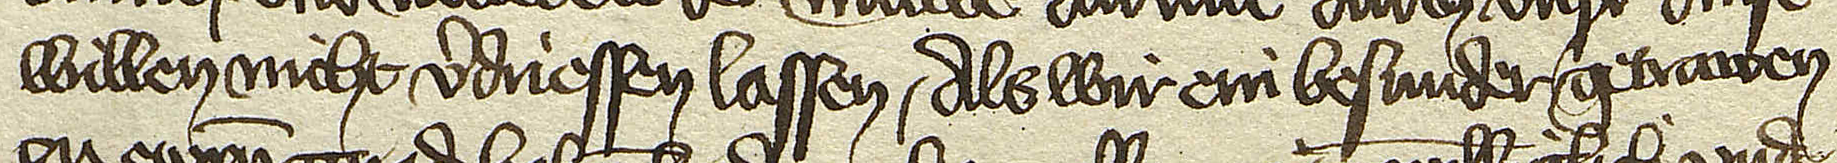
willen nicht v*drieſſen laſſen / Als wir ein beſunder getrawen
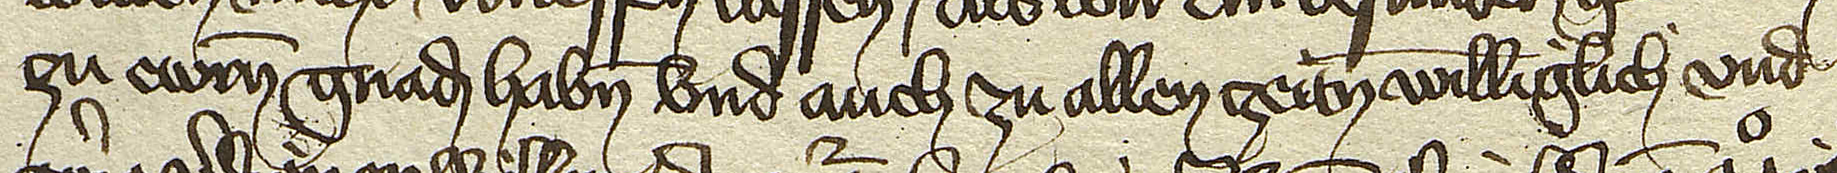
cʒu ewrn* gnad* habn* vnd auch cʒu allen cʒeitn* williglich vnd
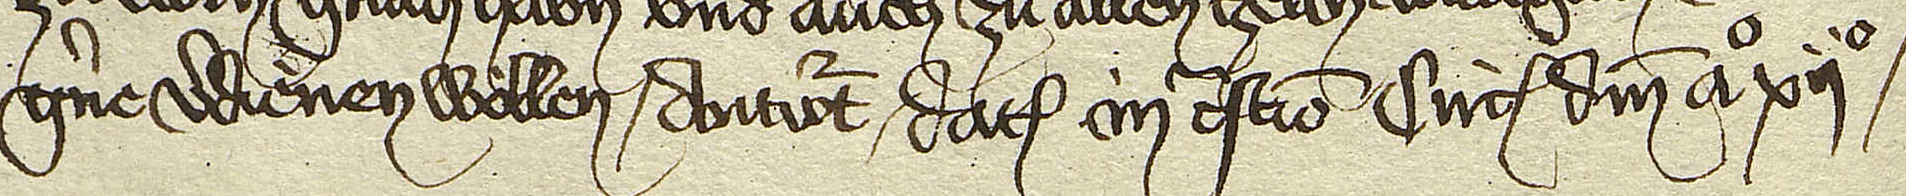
g*ne v*dienen wöllen / Antwt* / dat* in cſtio* Circ* dni* a* xii* /
